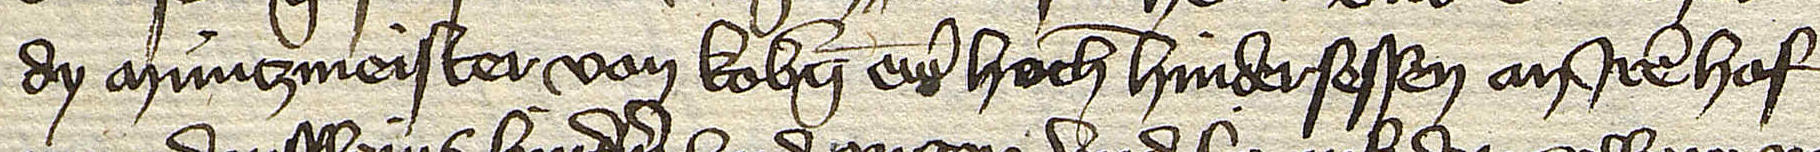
dy Müncʒmeiſter von kob*g ew* hoch* hinderſeſſen an Ire* hof
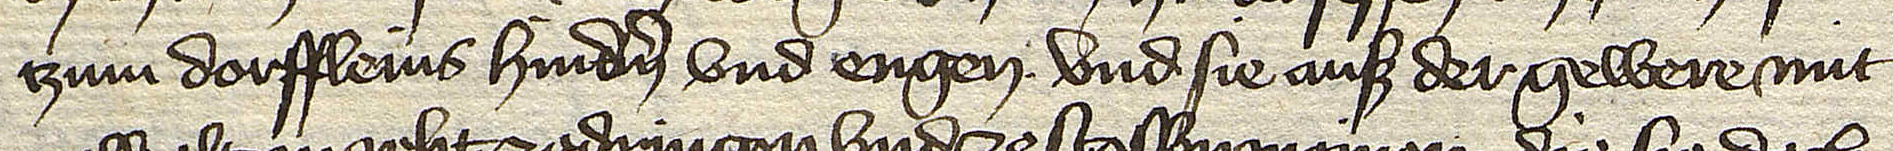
cʒum dorffleins hind*n vnd engen . vnd ſie auſʒ der gewere mit
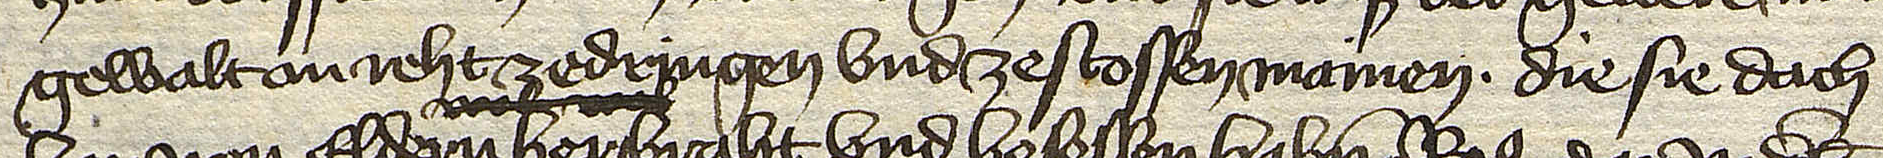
gewalt an reht cʒedringen vnd cʒeſtoſſen mainen . die ſie doch
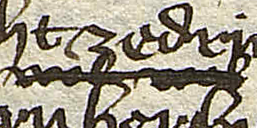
wol wol
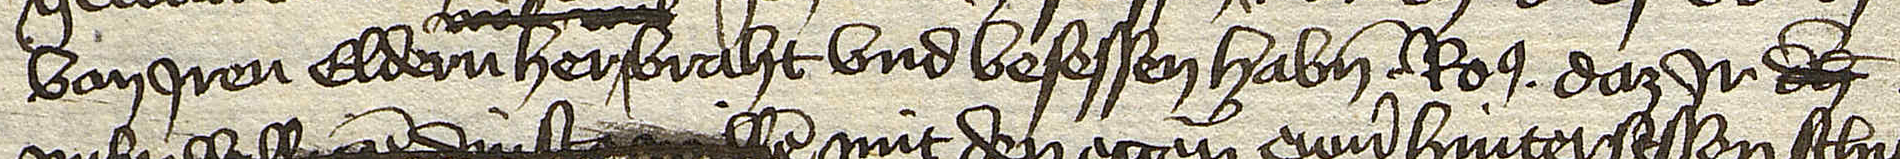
von Iren Eldern her braht vnd beſeſſen habn* . Ro* . daʒ Ir dh*
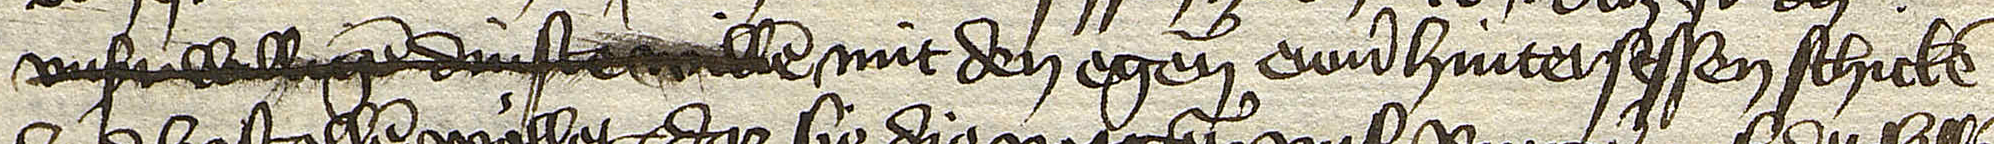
vnſ*n willge* dinſte wille* mit den egen* ewn* hinterſeſſen ſchicke*
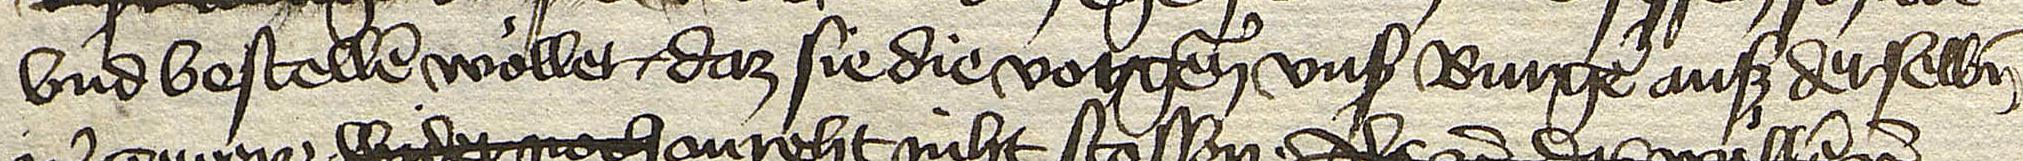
vnd beſtelle* wöllet / daʒ ſie die vorgen* vnſ* Burge* auſʒ derſelbn*
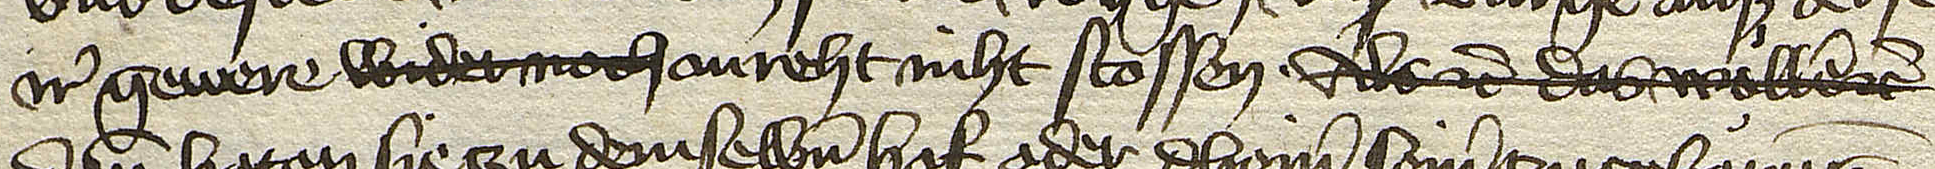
ir* gewere wider noch onreht niht ſtoſſen . Als ec* das wölle* ec*
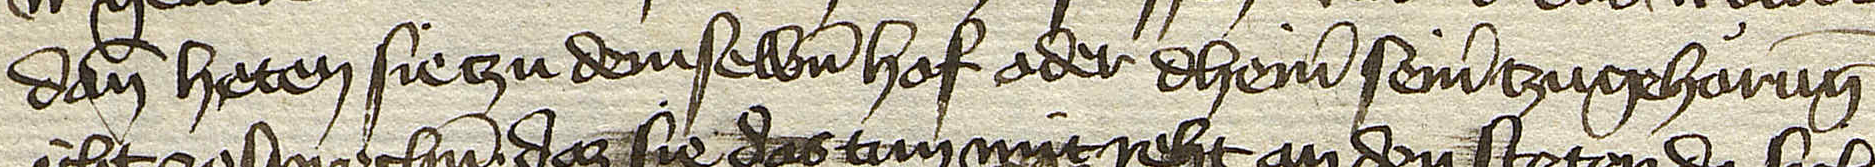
dan* heten ſie cʒu demſelbn* hof oder dhein* ſein* cʒugehöru*g
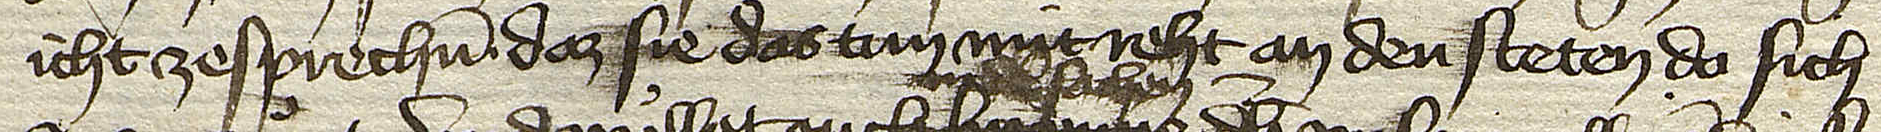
icht cʒeſprechn* . daʒ ſie das tun mit reht an den ſteten do ſich
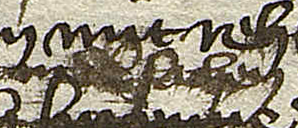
in de* ſachen
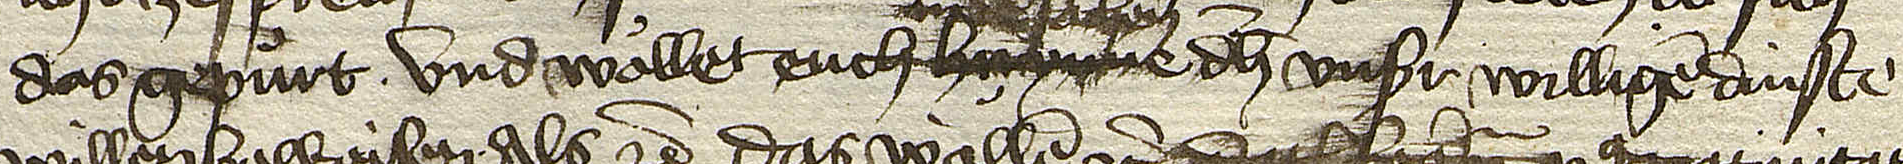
das gepürt . vnd wöllet euch hirynne dh* vnſ*r willige* dinſte
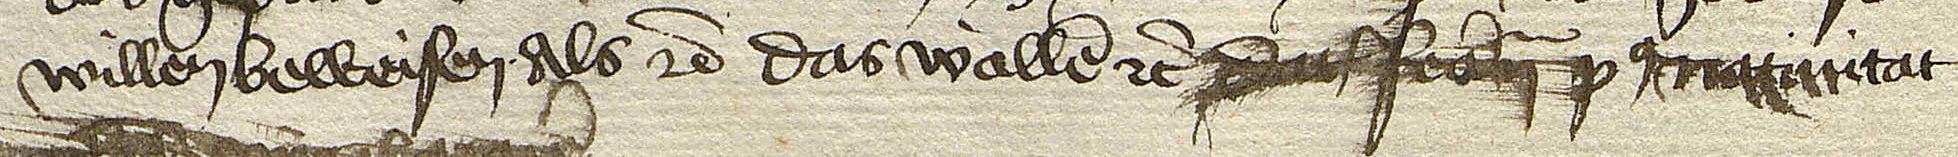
willen beweiſen . Als ec* Das wölle* ec* Dat* fea* ii* p* natiuitat
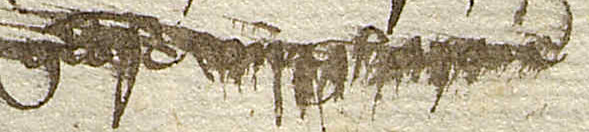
gloſe* virg* Maie*
